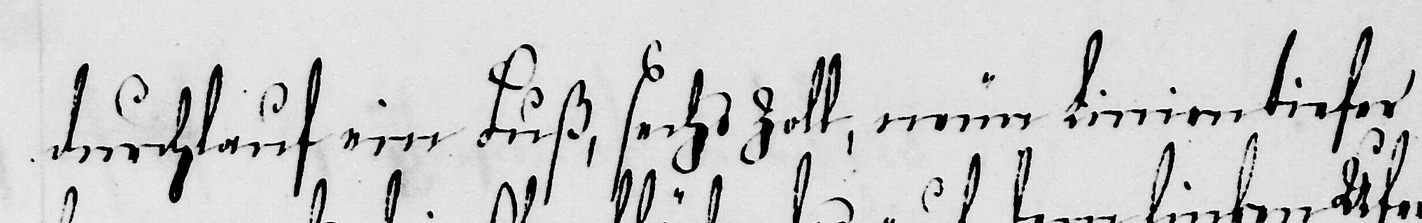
durchlauf ein Fuß, sechs Zoll, neun Linien tiefer
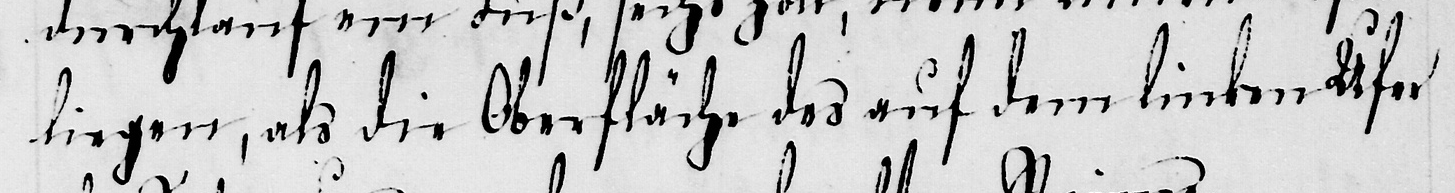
liegen, als die Oberfläche des auf dem linken Ufer
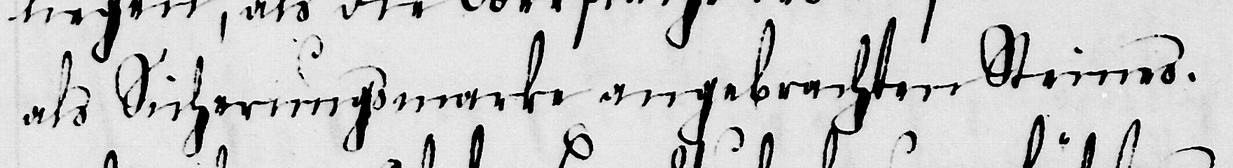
als Sicherungsmarke angebrachten Steines.
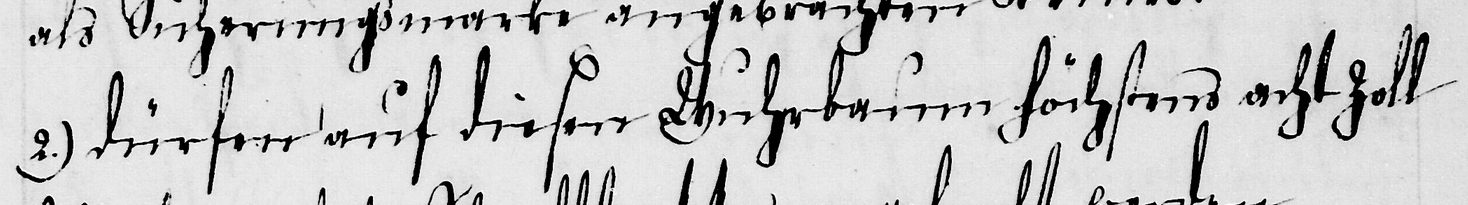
2.) Dürfen auf diesen Wuhrbaum höchstens acht Zoll
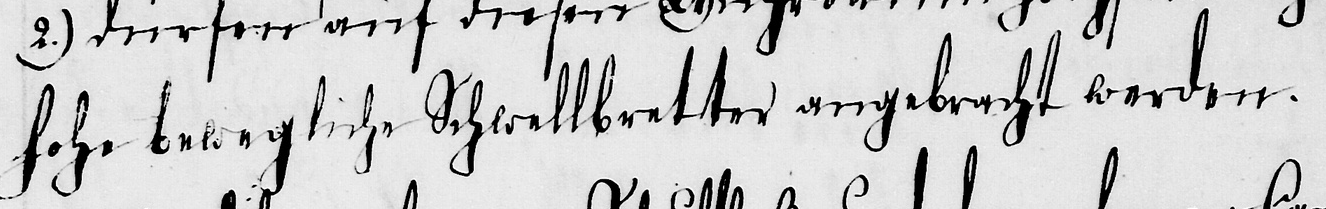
hohe bewegliche Schwellbretter angebracht werden.
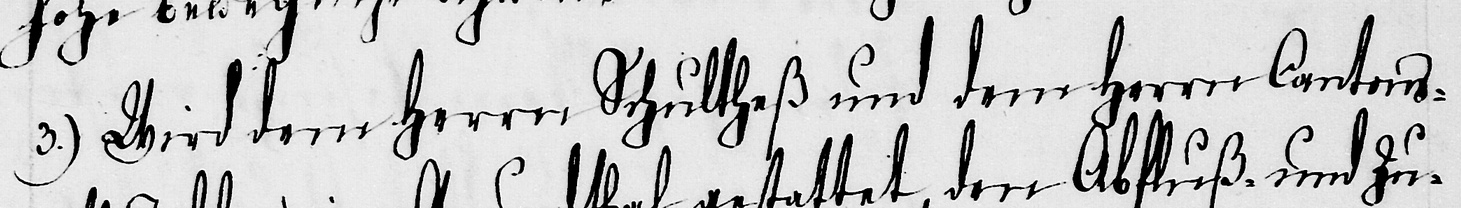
3.) Wird dem Herrn Schultheß und dem Herrn Cantons¬
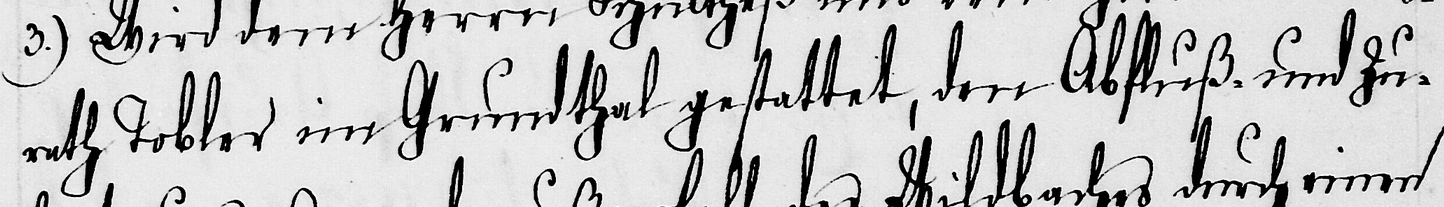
rath Tobler im Grundthal gestattet, den Abfluß- und Zu¬
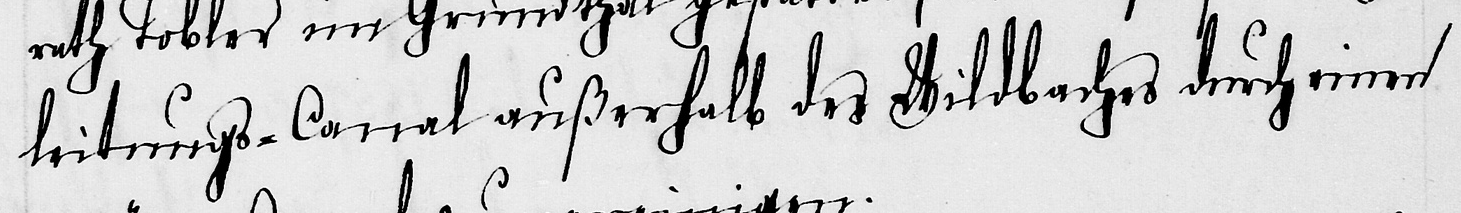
leitungs-Canal außerhalb des Wildbaches durch einen
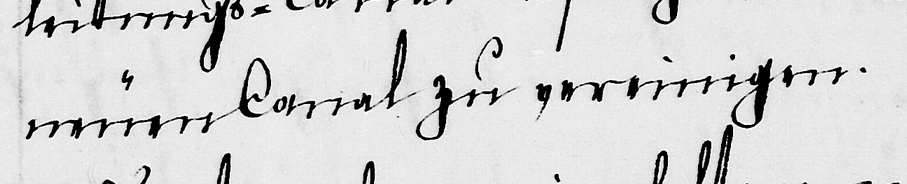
neuen Canal zu vereinigen.
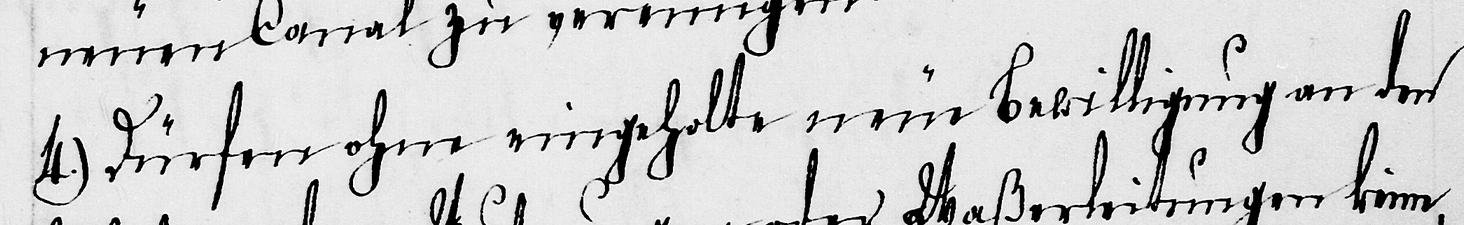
4.) Dürfen ohne eingeholte neue Bewilligung von den
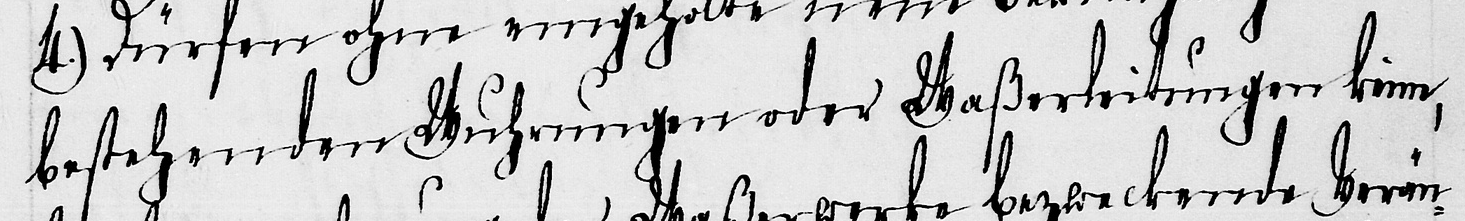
bestehenden Wuhrungen oder Waßerleitungen keine,
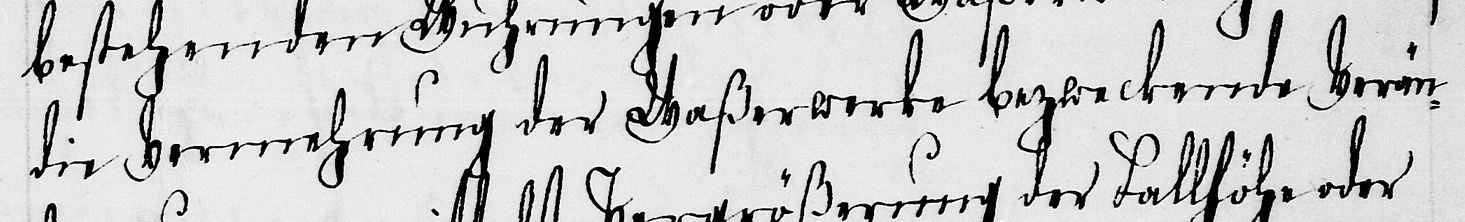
die Vermehrung der Waßerwerke bezweckende Verän¬
